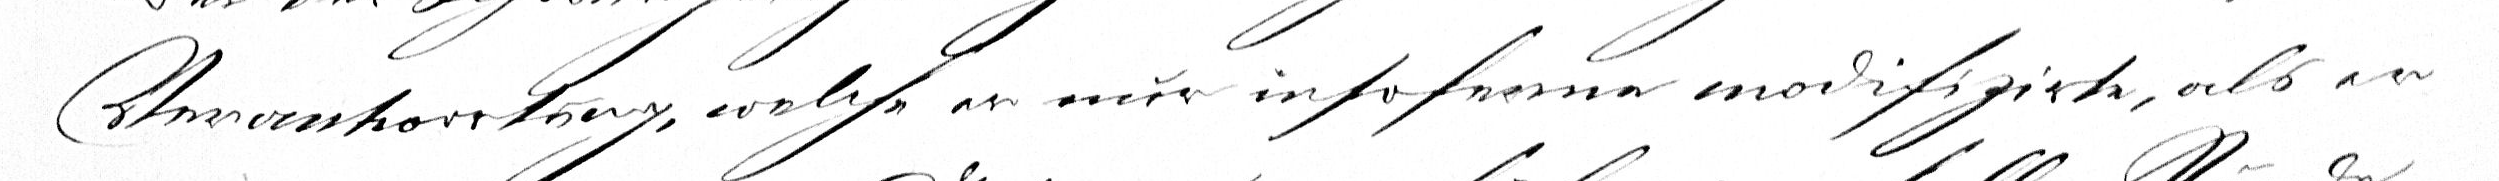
Verantwortung, welche er nur insofernemodifizirte, als er
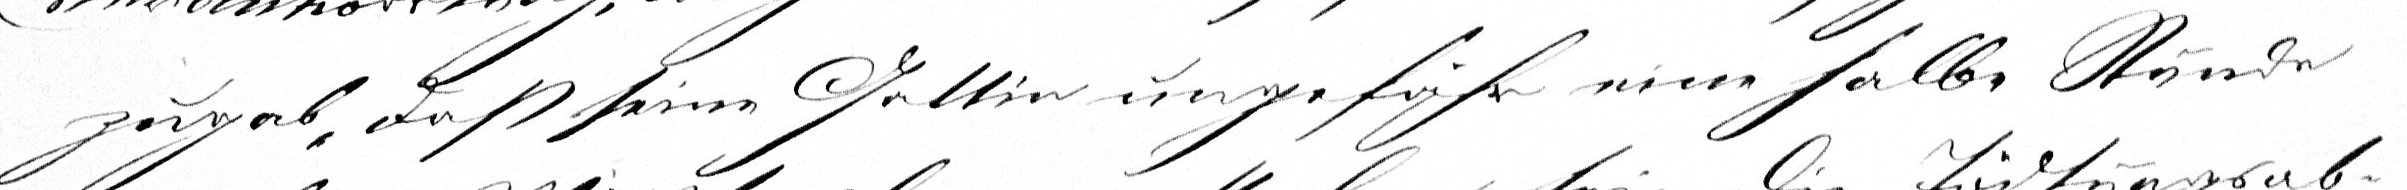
zugab, daß seineGattin ungefähr eine halbe Stunde
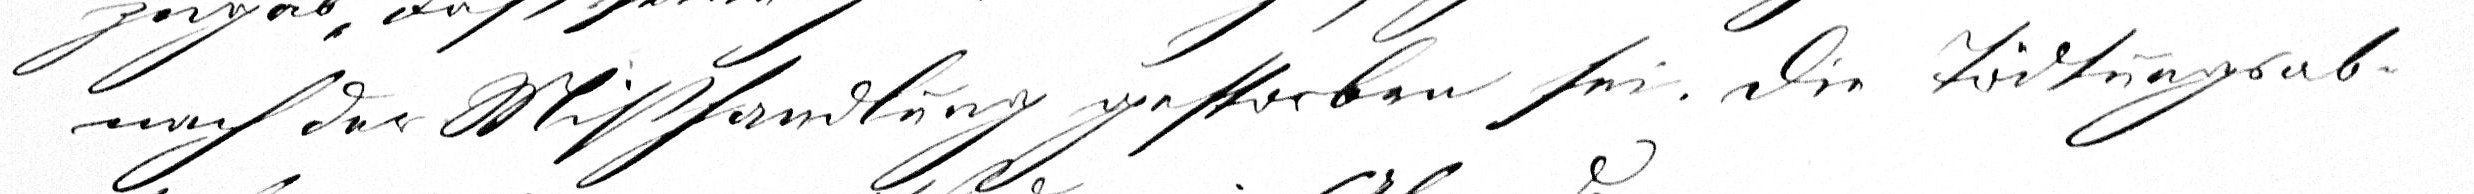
nach der Mißhandlung gestorben sei. Die Tödtungsab¬
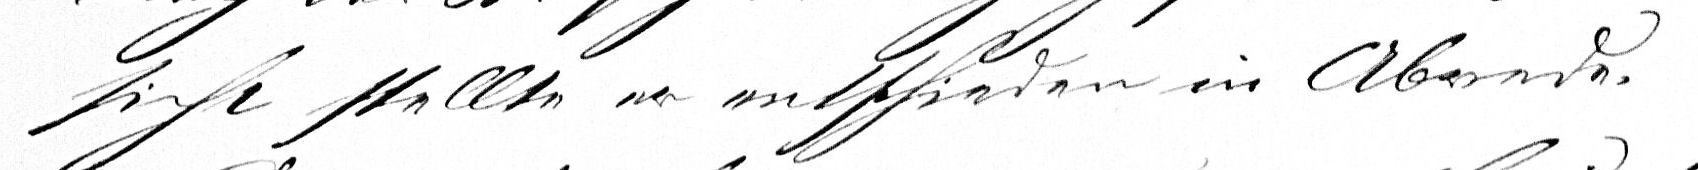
sicht stellte er entschieden in Abrede.
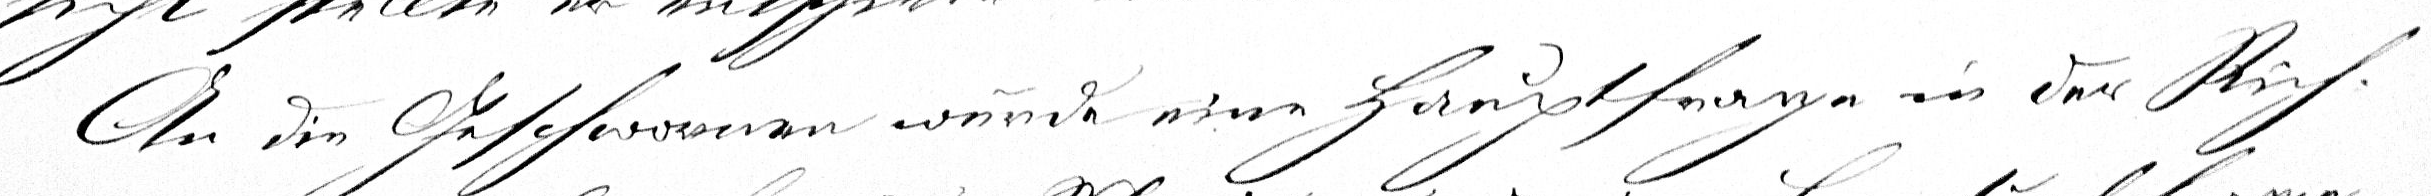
An die Geschwornen wurde eine Hauptfrage in der Rich¬
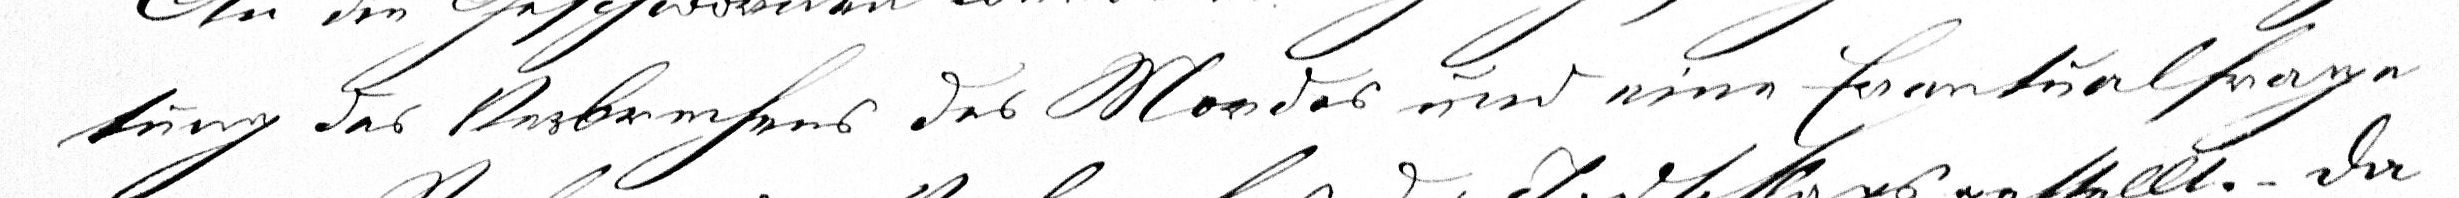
tung des Verbrechens des Mordes und eine Eventualfrage
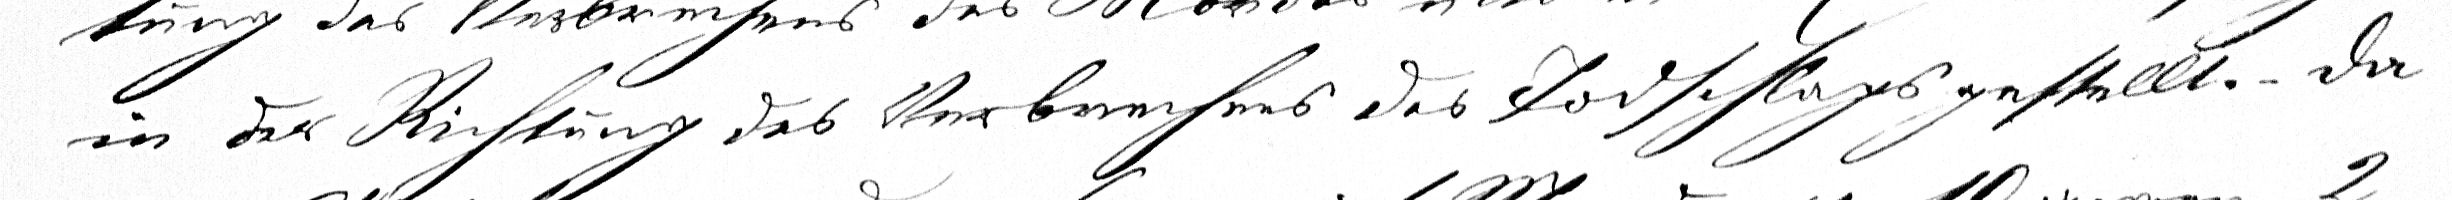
in der Richtung des Verbrechens des Todschlags gestellt.- Da
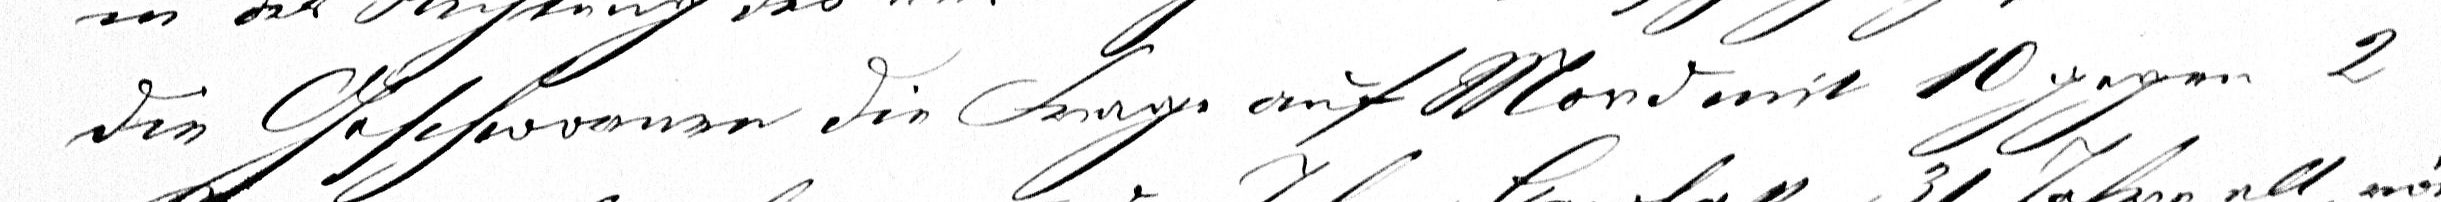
die Geschwornenr die Frage auf Mord mit 10 gegen 2
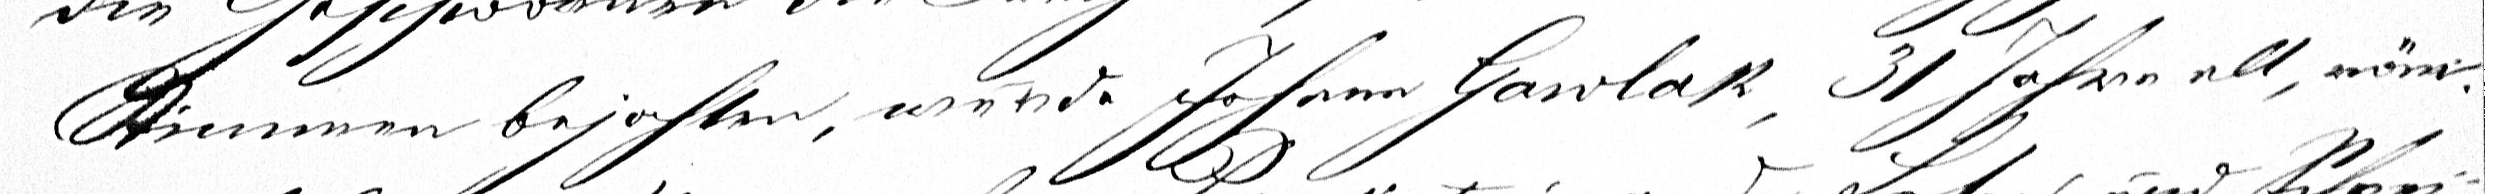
Stimmen bejahten, wurde Johann Gawlak, 31 Jahre alt, röni¬
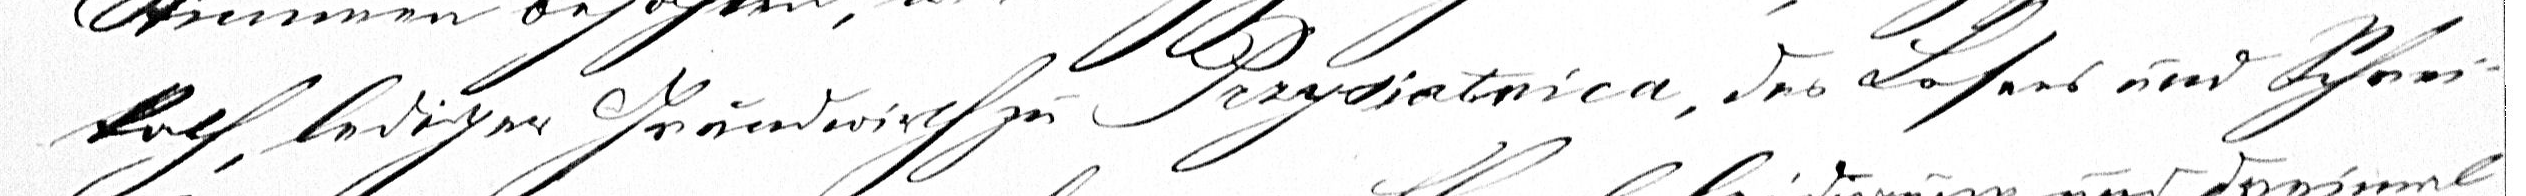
kath, lediger Grundwirth zu Przysiatnica, des Lesens und Schrei¬
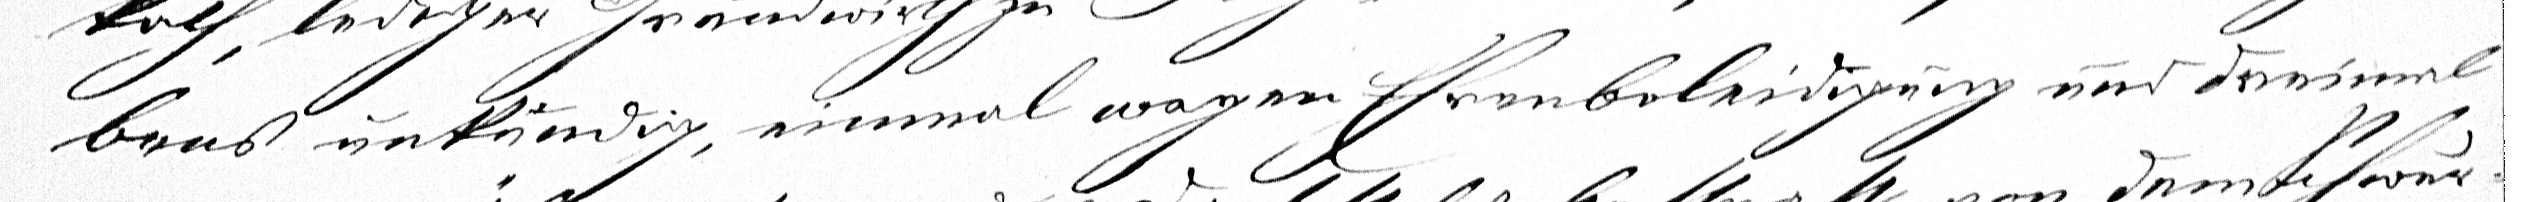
bens unkundig, einmal wegen Ehrenbeleidigung und dreimal
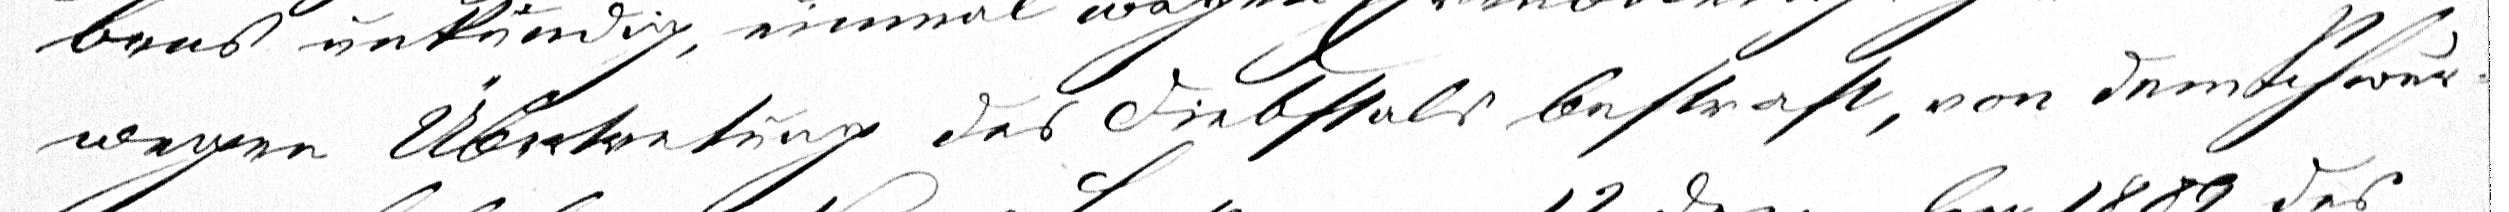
wegen Übertretung des Diebstals bestraft, von dem Schwur¬
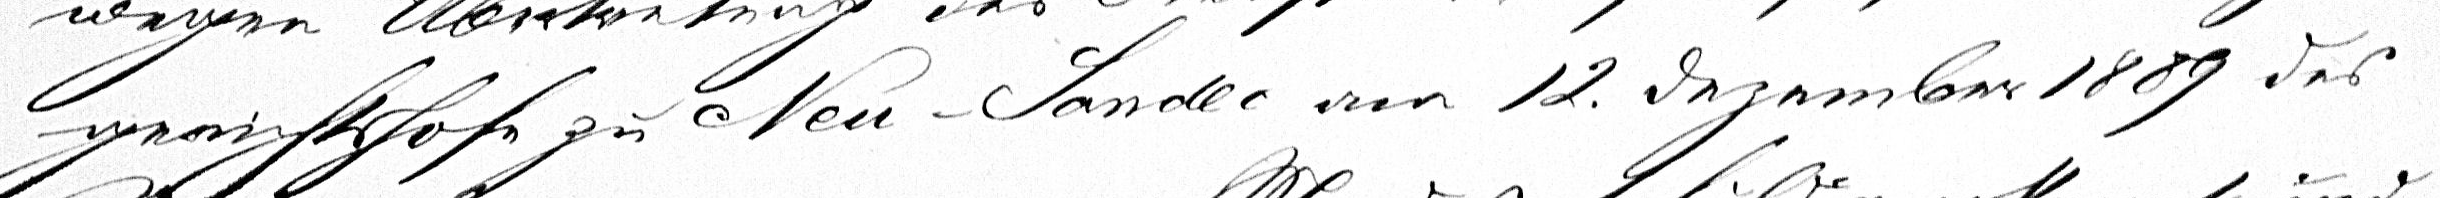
gerichtshofe zu Neu - Sandlo am 12. Dezember 1889 des
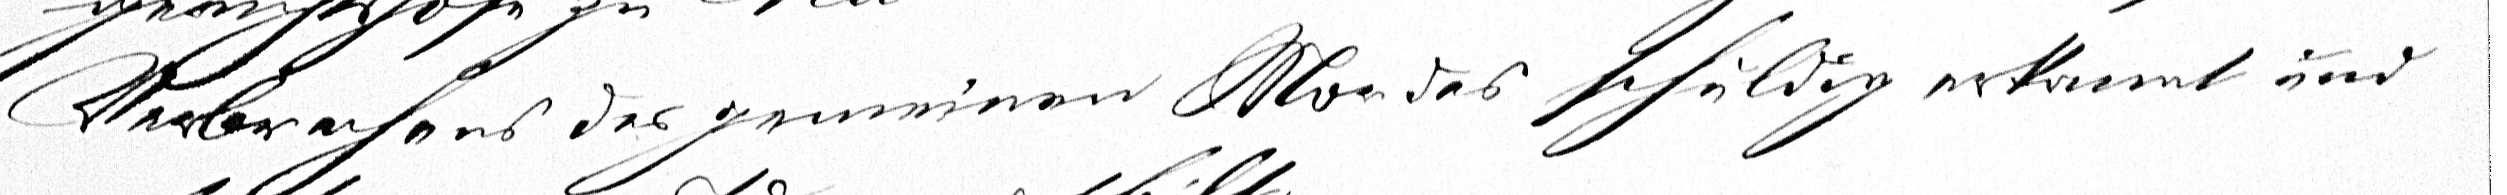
Verbrechens des gemeinen Mordes schuldig erkannt und
